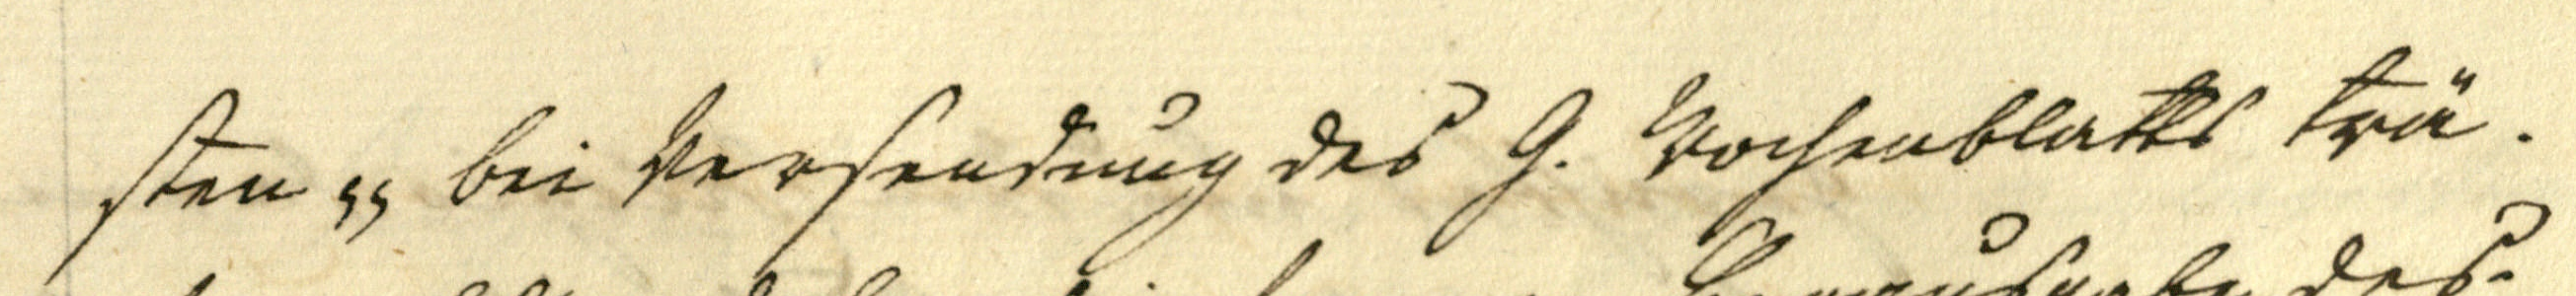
sten bei Versendung des G. Wochenblatts trä¬
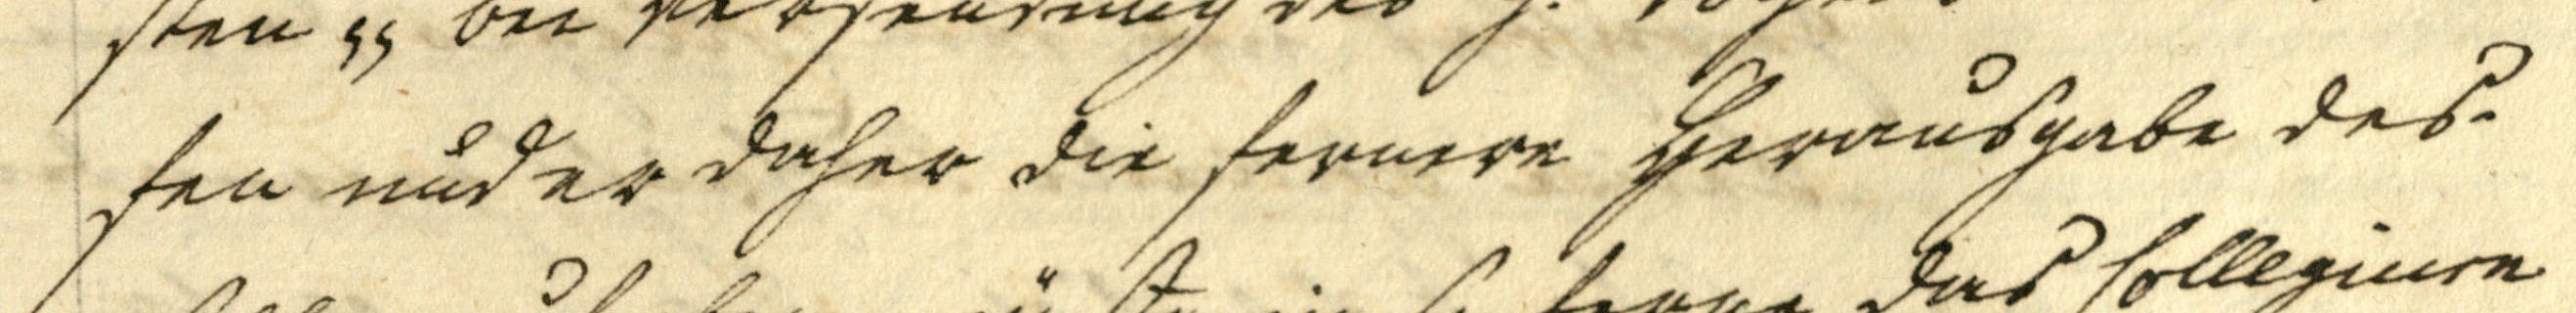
fen und er daher die fernere Herrausgabe des¬
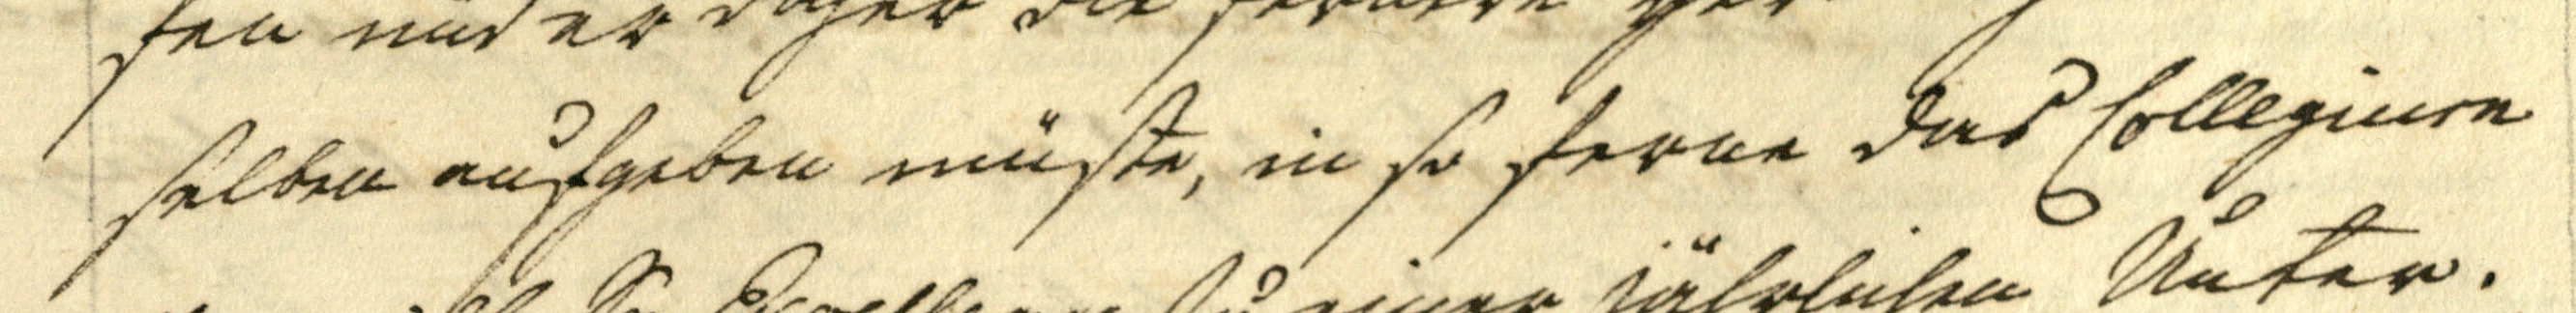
selben aufgeben müßte, in so ferne das Collegium
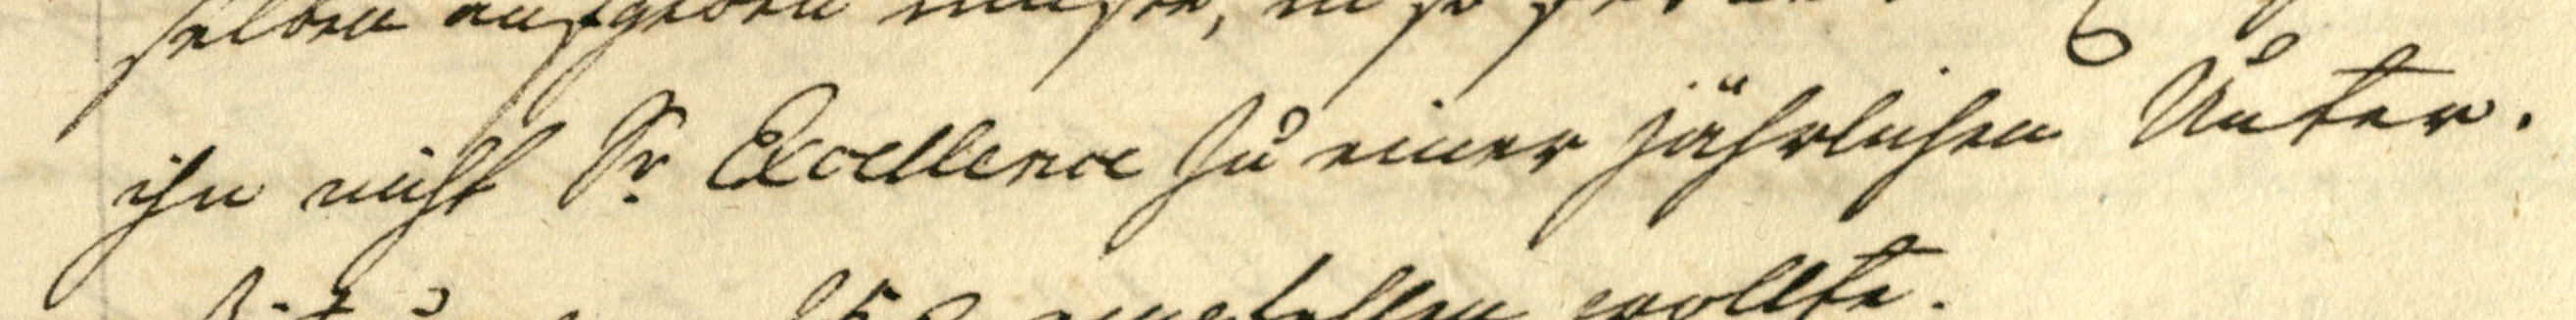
ihn nicht Sr Excellence zu einer jährlichen Unter¬
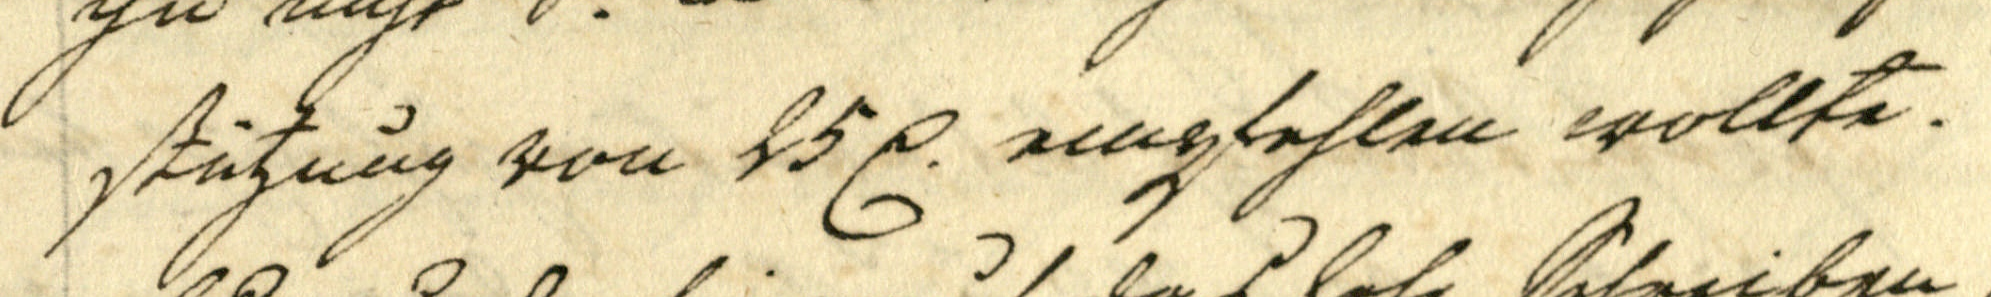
stützung von 25 l. empfehlen wollte.
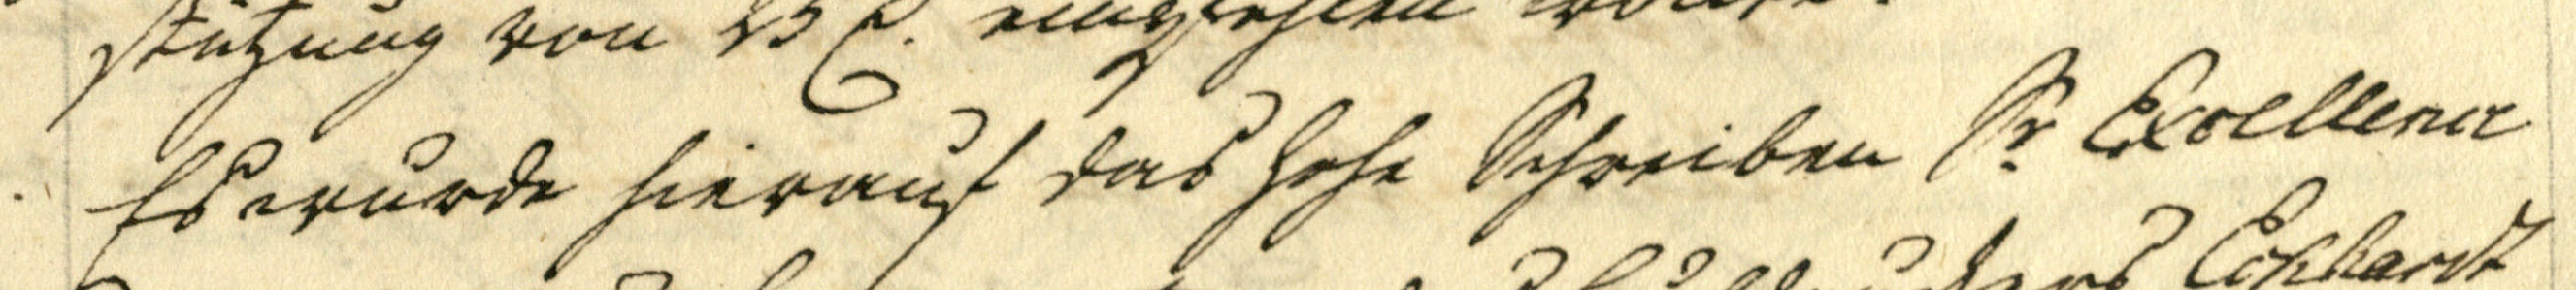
Es würde hierauf das hohe Schreiben Sr Excellence
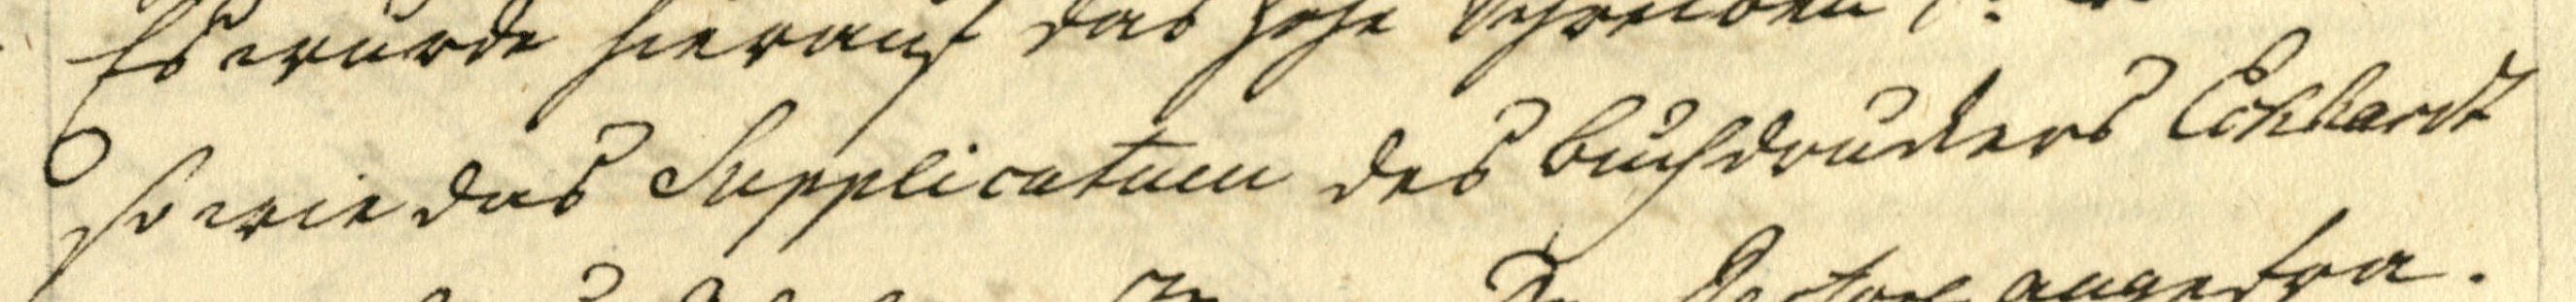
so wie das Supplicatum des Buchdruckers Eckhardt
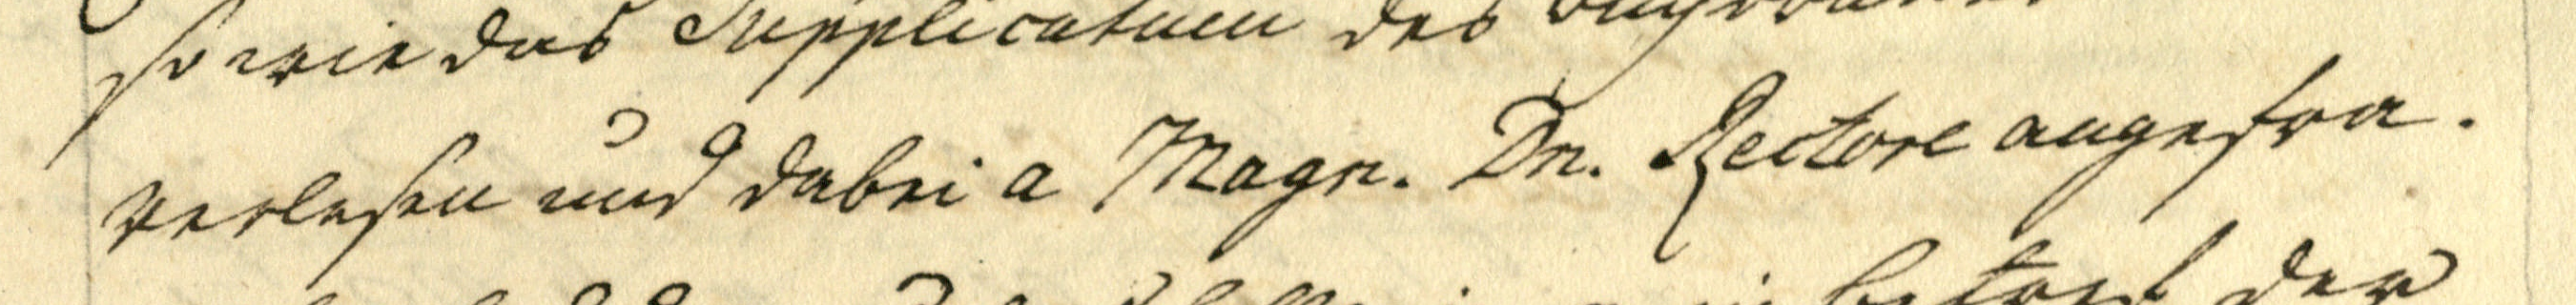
verlesen und dabei a Magn. Dn. Rectore angefra¬
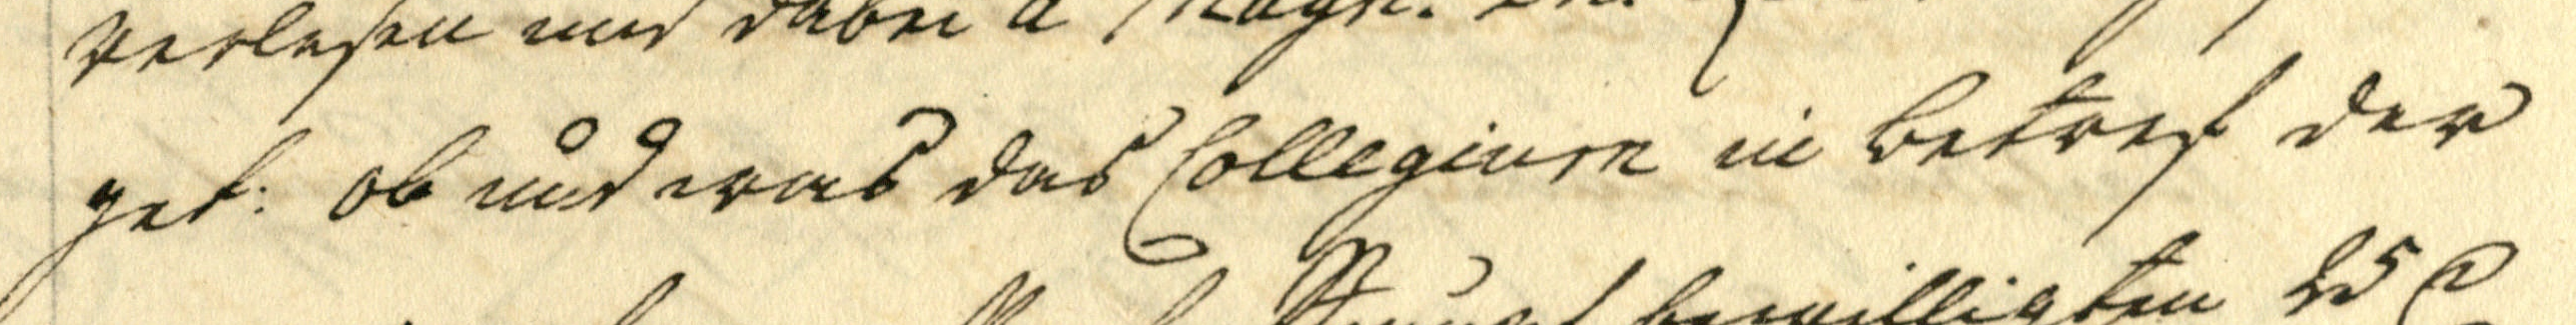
get: ob und was das Collegium in Betref der
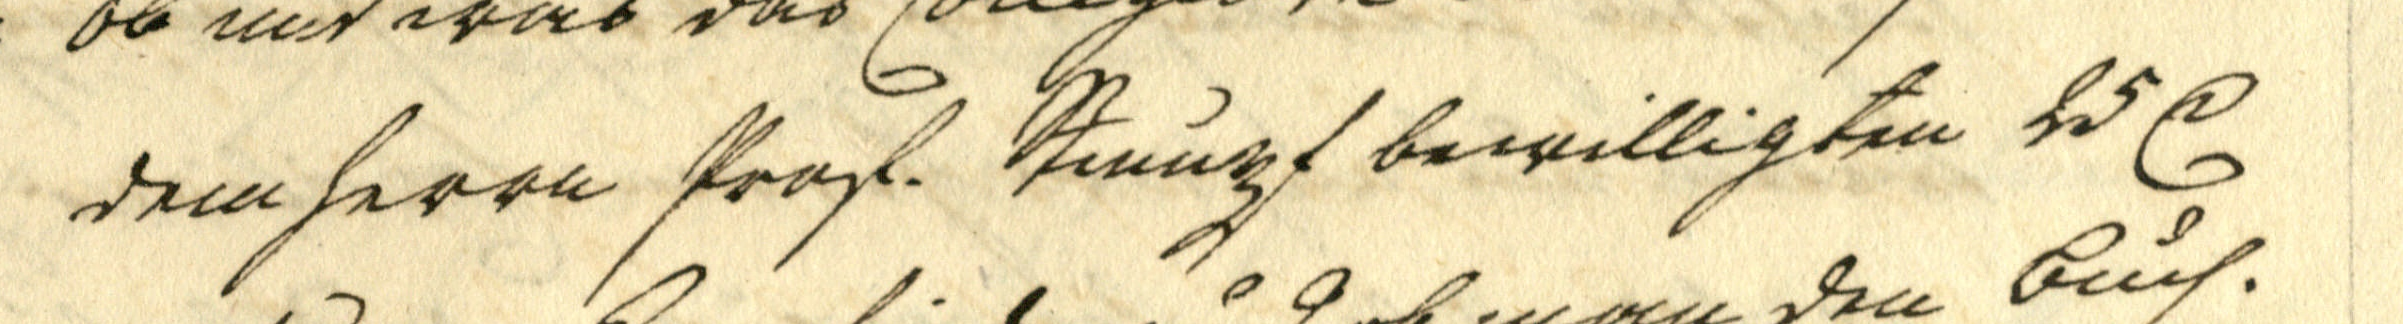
dem Herrn Prof. Stumpf bewilligten 25 l.
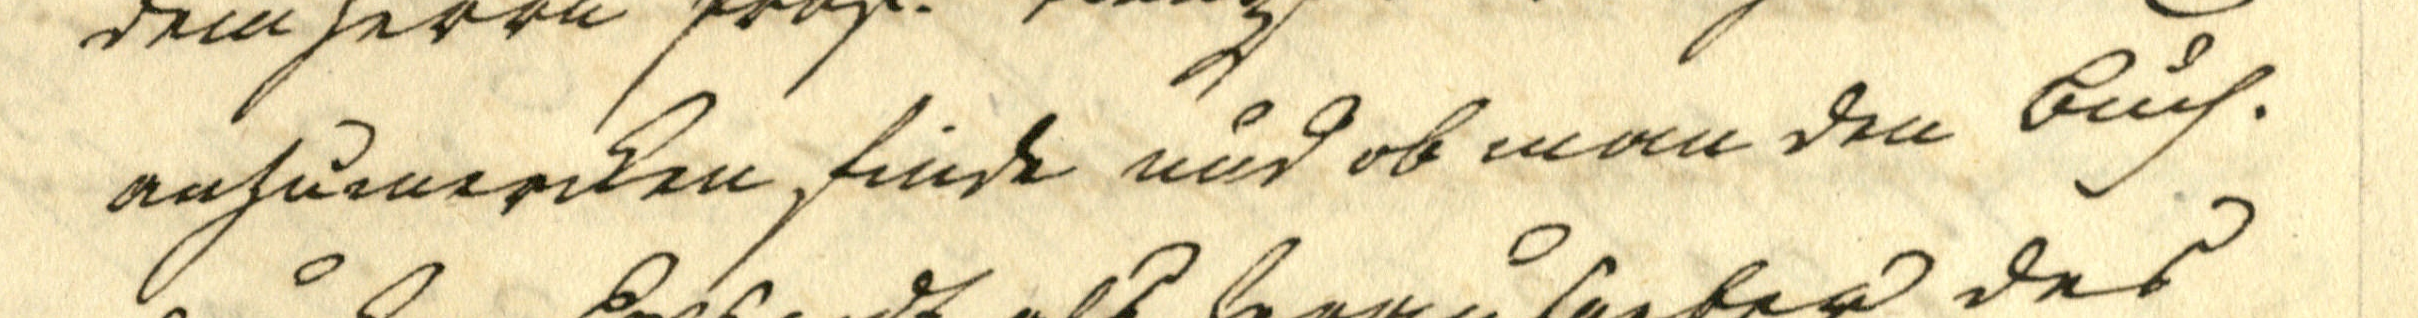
anzumercken finde und ob man den Buch¬
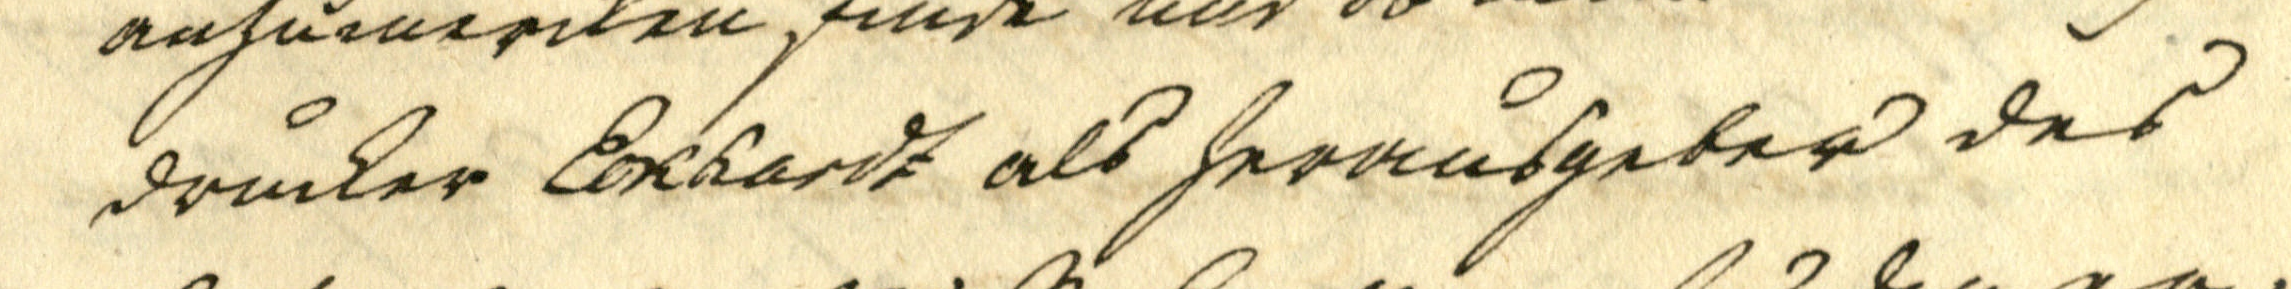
drucker Eckhardt als Herausgeber des
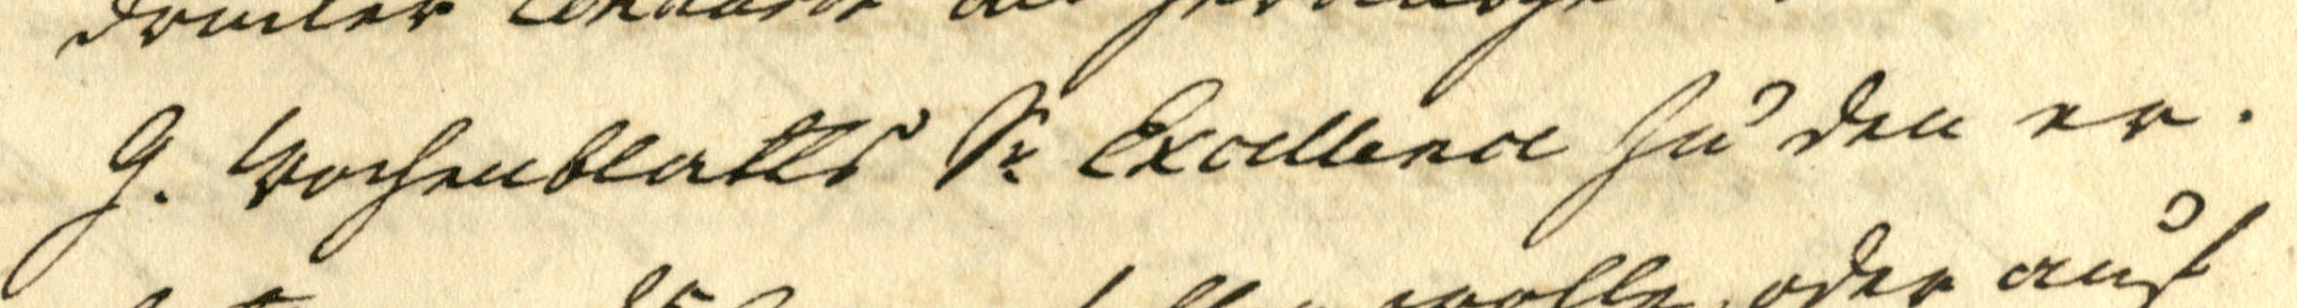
G. Wochenblatts Sr Excellence zu den er¬
